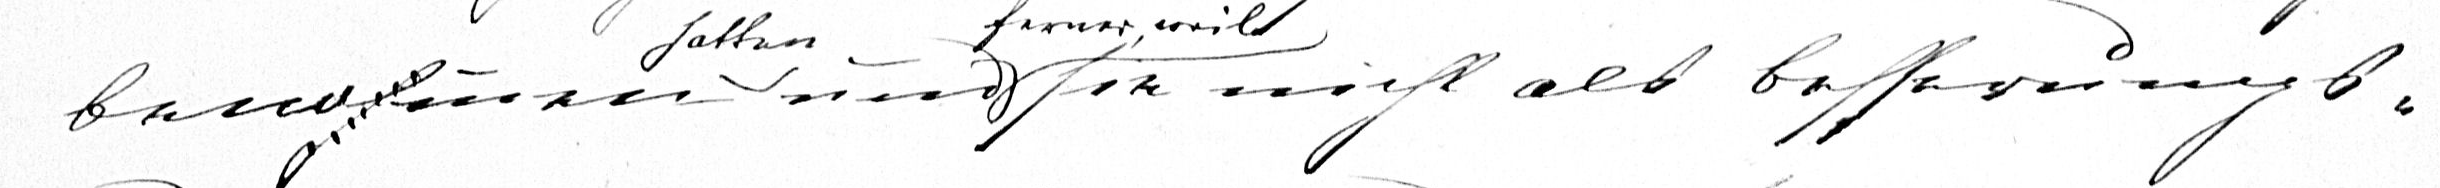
benommen und sie nicht als besser¬
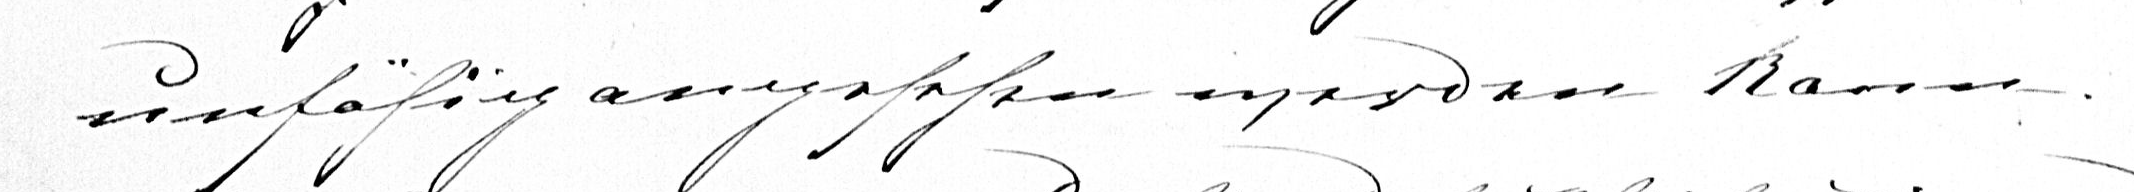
ungsunfähigangesehen werden kann.
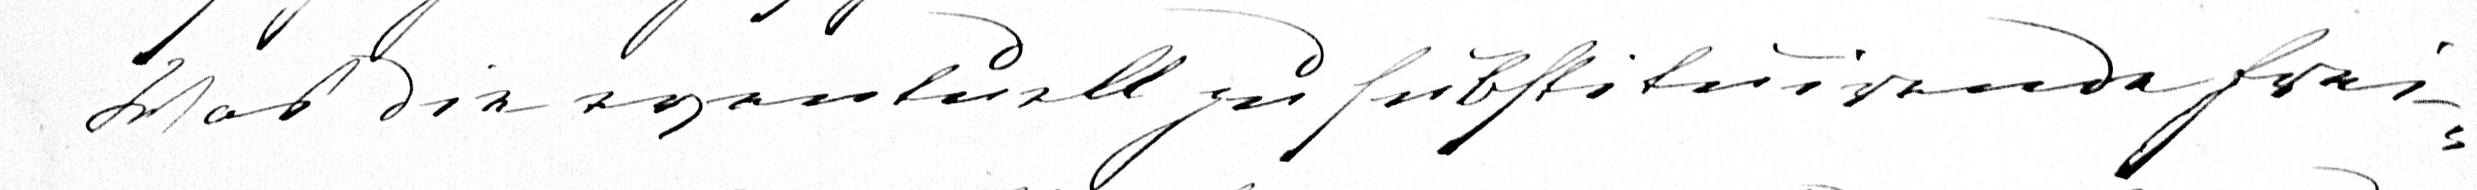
Was die eventuell zu substituirende Frei¬
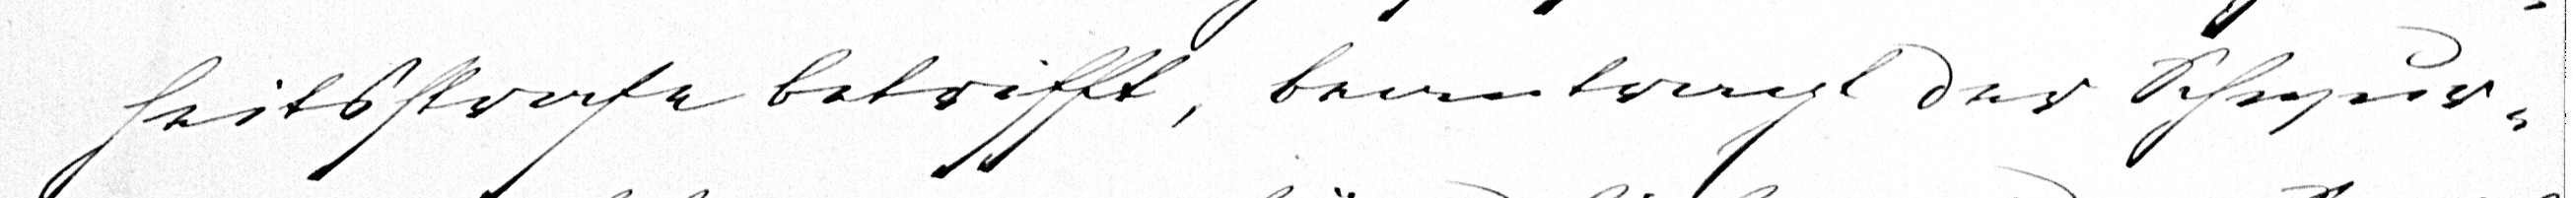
heitsstrafe betrifft, beantragt der Schwur¬
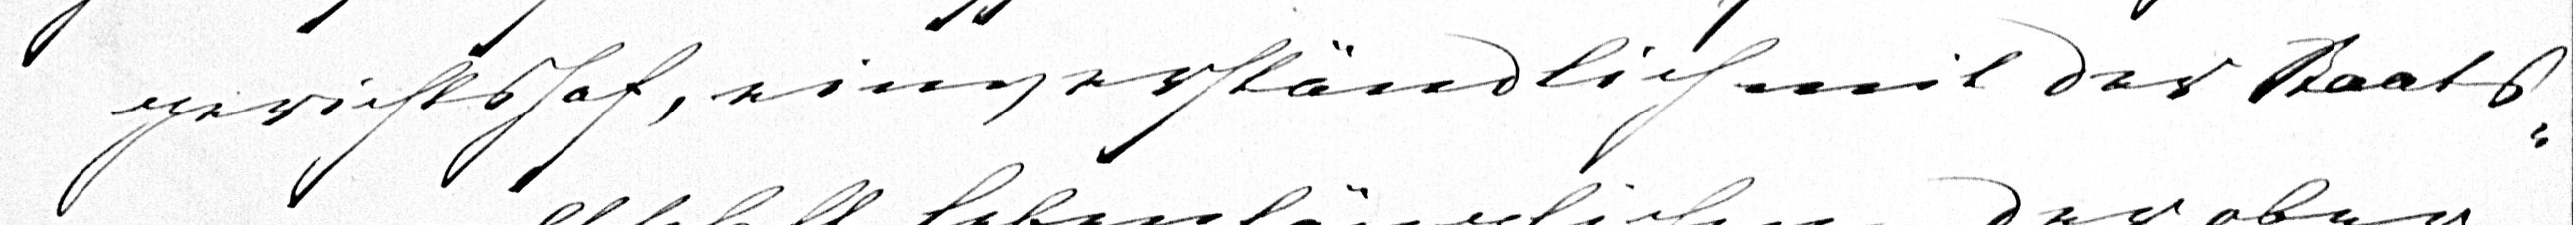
gerichtshof, einverständlich mit der Staats¬
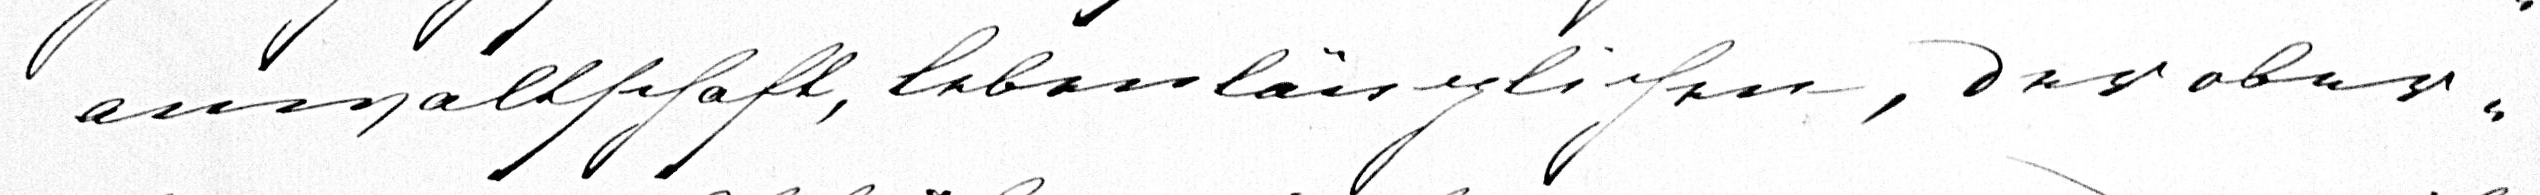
anwaltschaft, lebenlänglichen, der ober¬
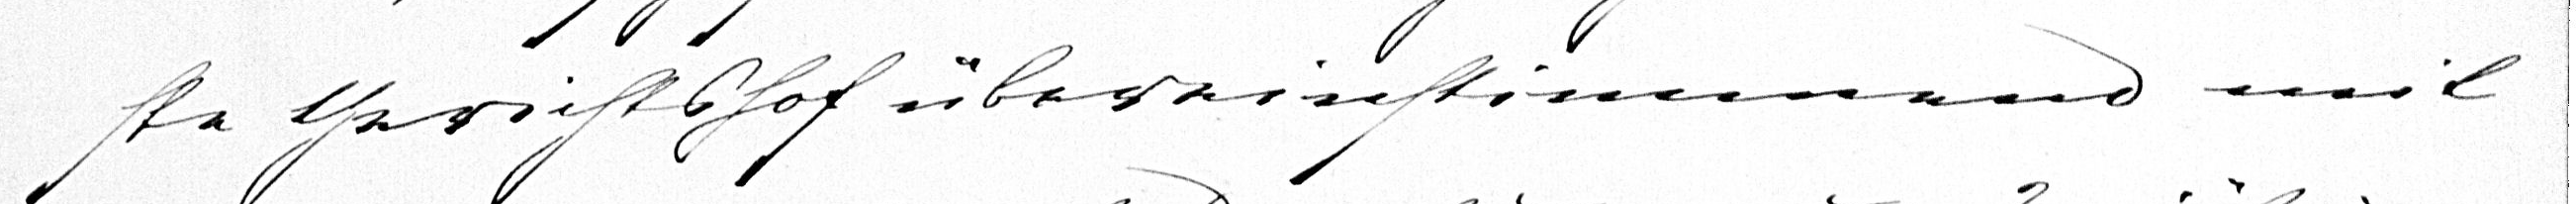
ste Gerichtshof übereinstimmend mit
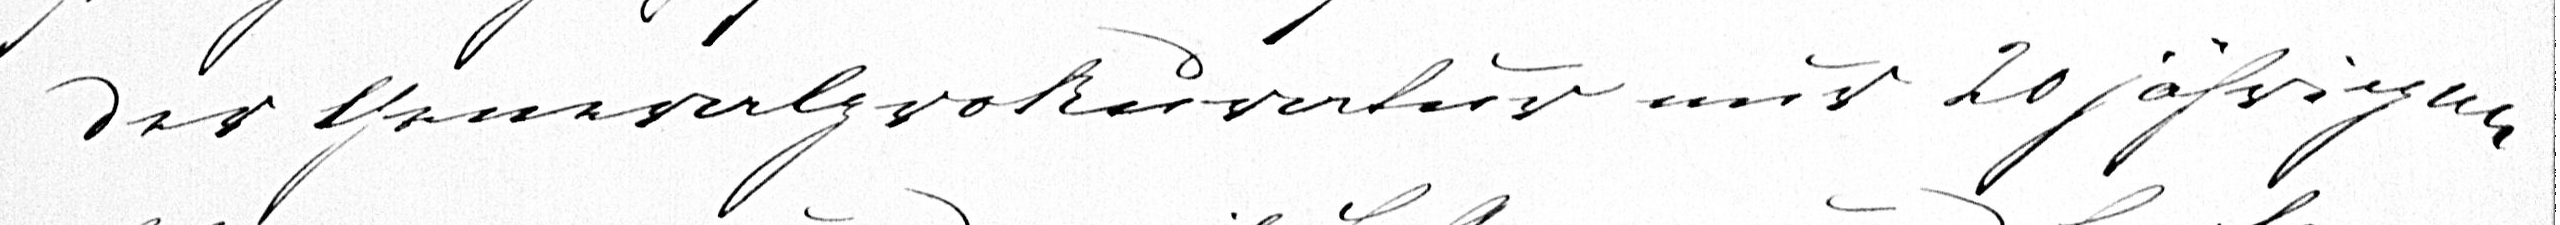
der Generalprokuratur nur 20 jährigen
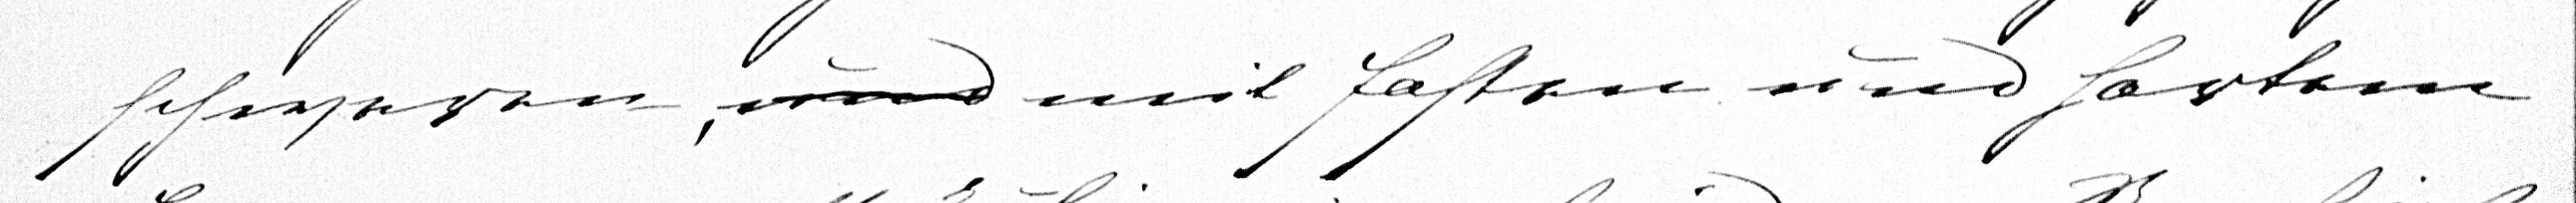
schweren, mit Fasten und hartem
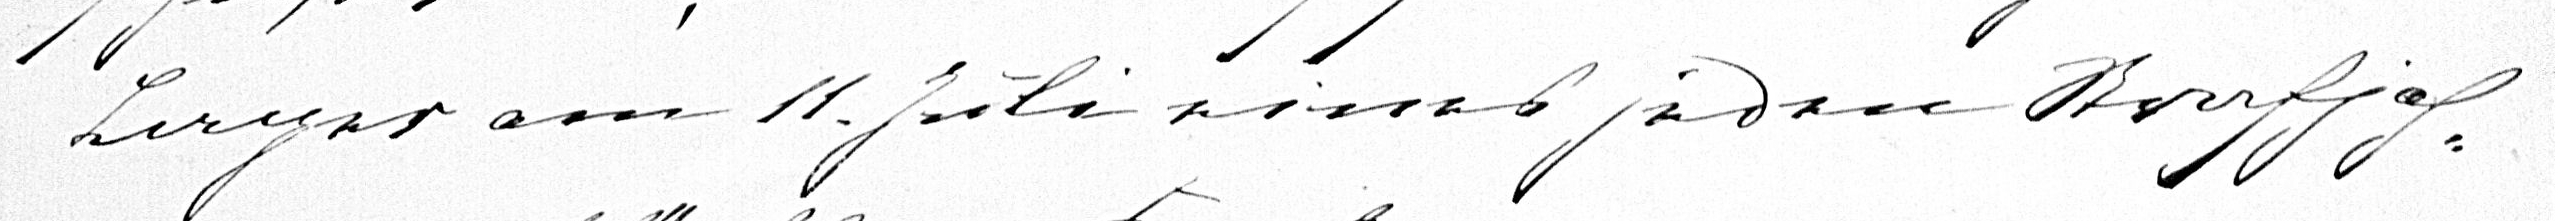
Lager am 11. Juli eines jeden Strafjah¬
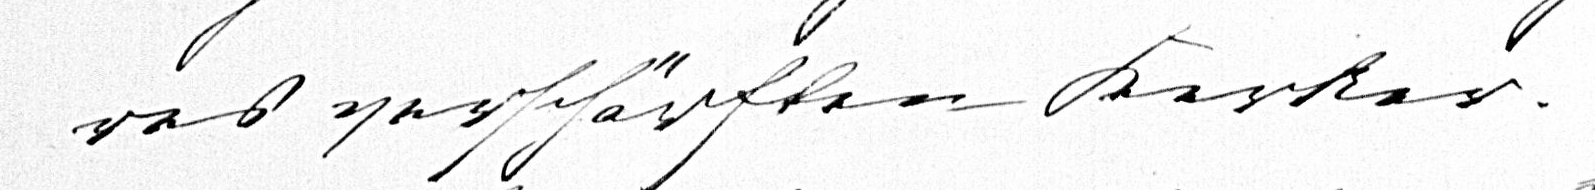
res verschärften Kerker.
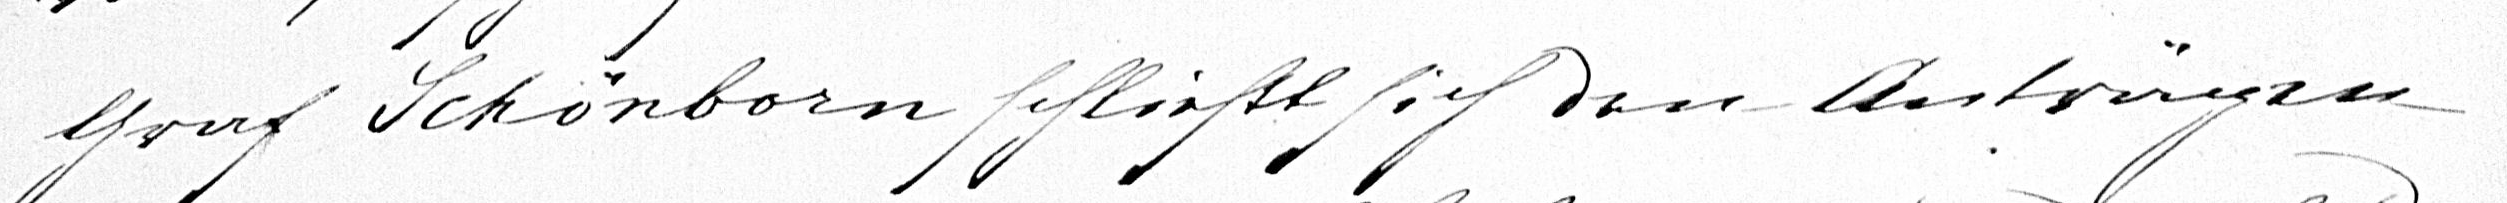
Graf Schönborn schließt sich den Anträgen
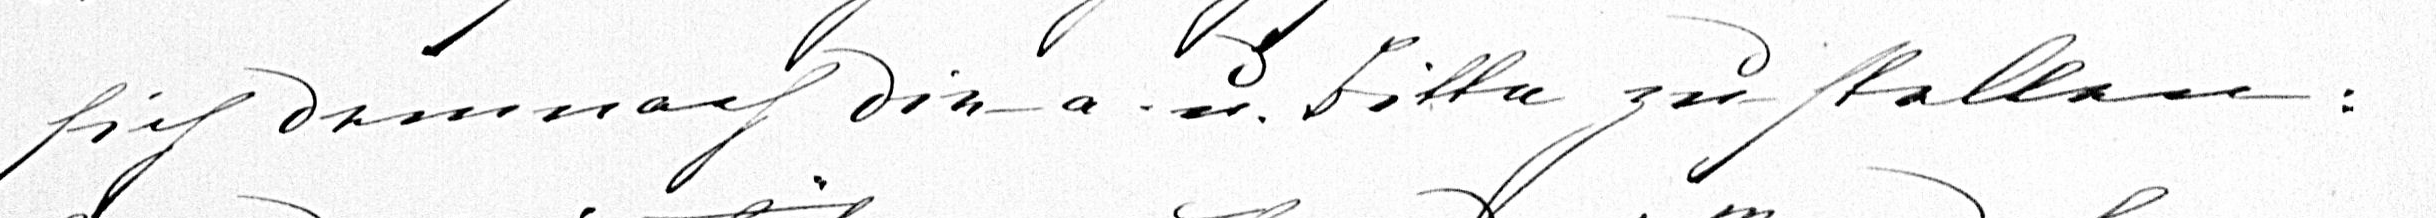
sich demnach die a. u. Bitte zu stellen:
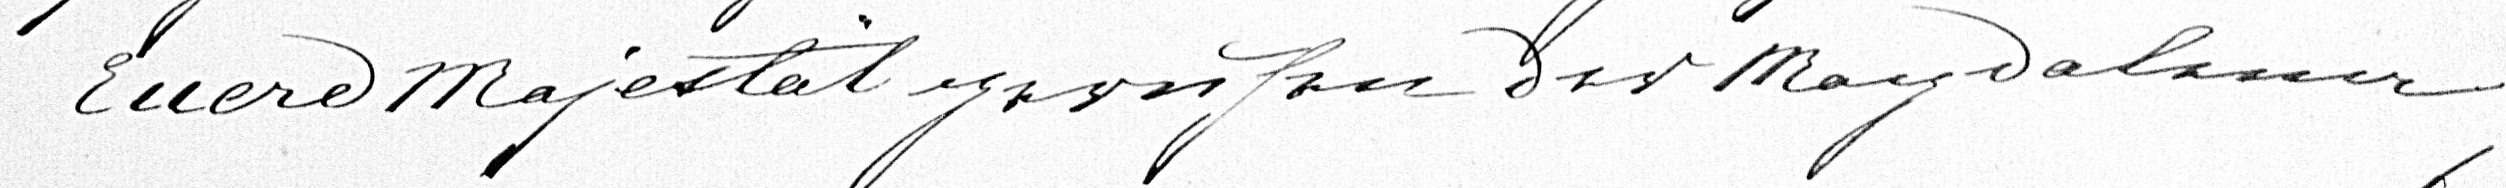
Euere Majestät geruhen der Magdalena
